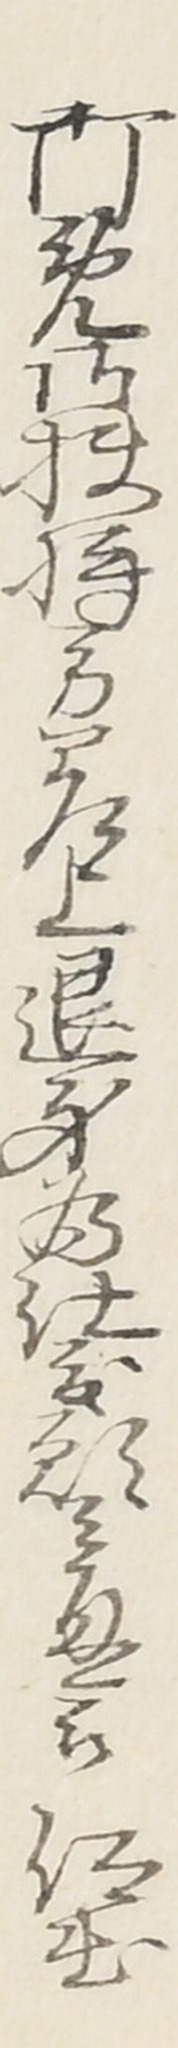御免御扶持方差上退身為仕度願之通被仰出
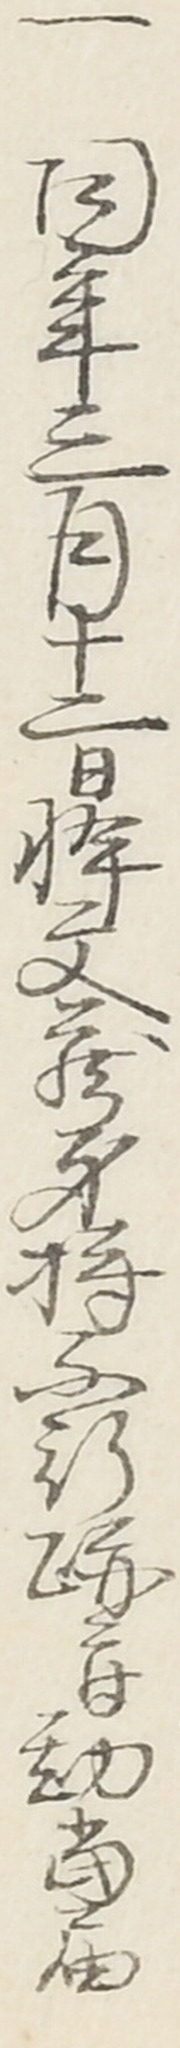一同年三月十二日忰文蔵身持不行跡ニ付勘当届
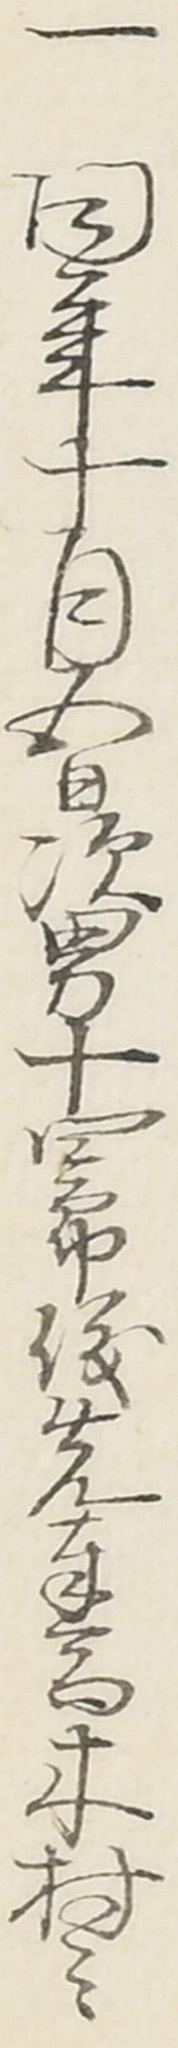一同年十月五日次男十四郎儀先達而木村之
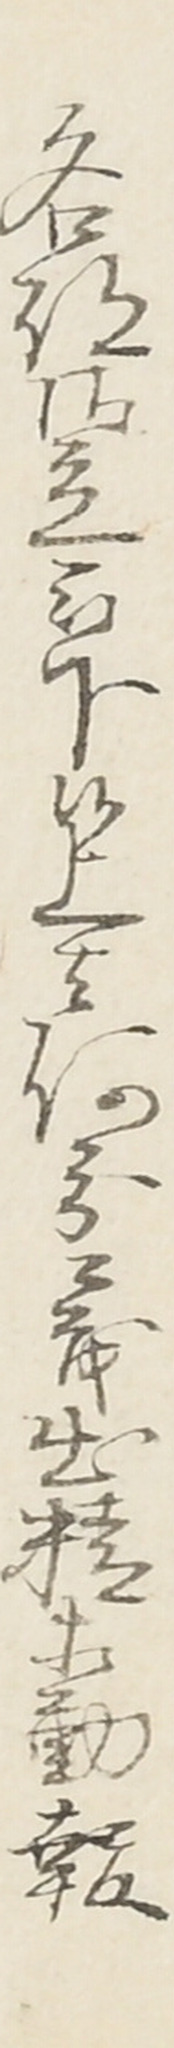名跡御立被下候上者何分ニ茂出精相勤報
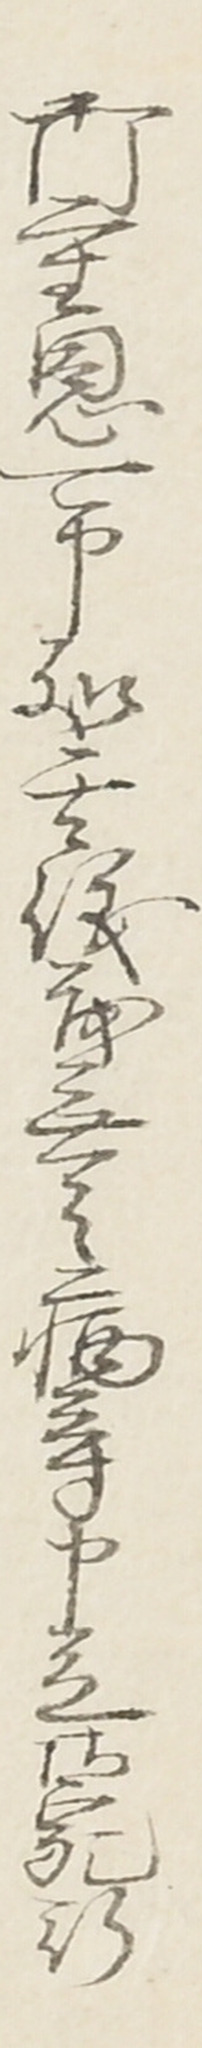御重恩可申処其儀茂無之病気申立御宛行
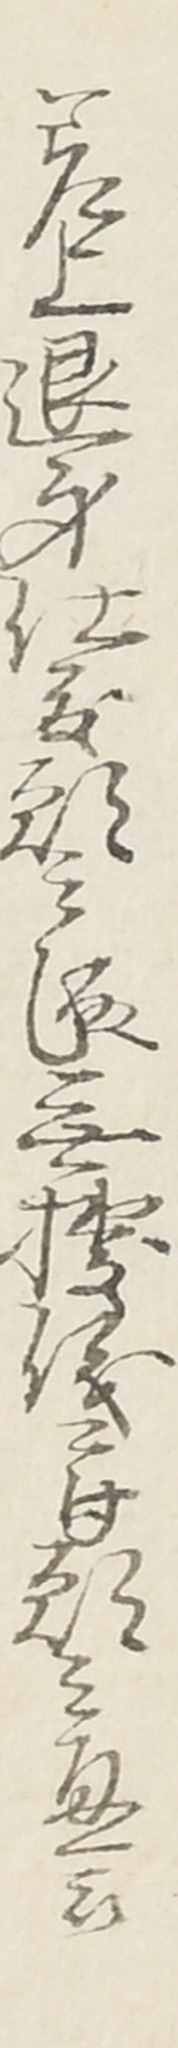差上退身仕度願之趣無拠儀ニ付願之通被
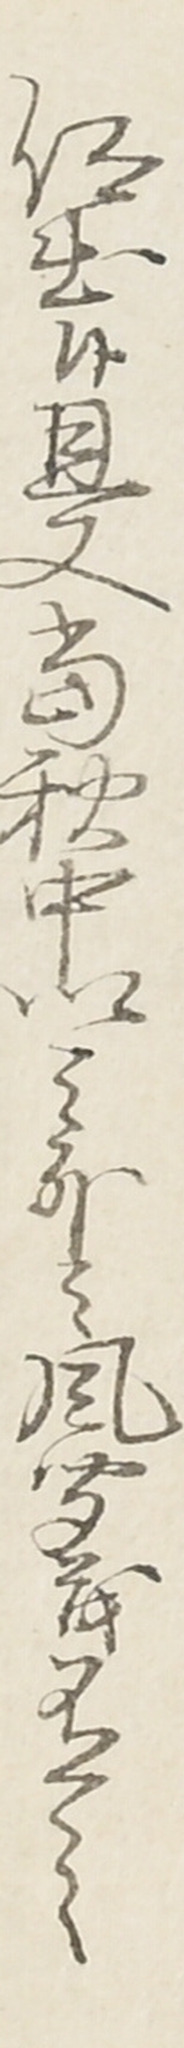仰出候且又当秋中以之外之風聞茂有之
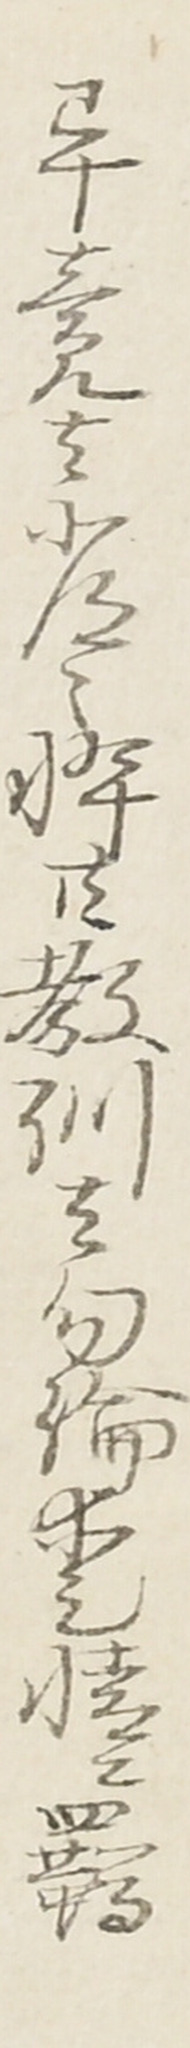畢竟者常々忰共教訓者勿論愛情ニ羈
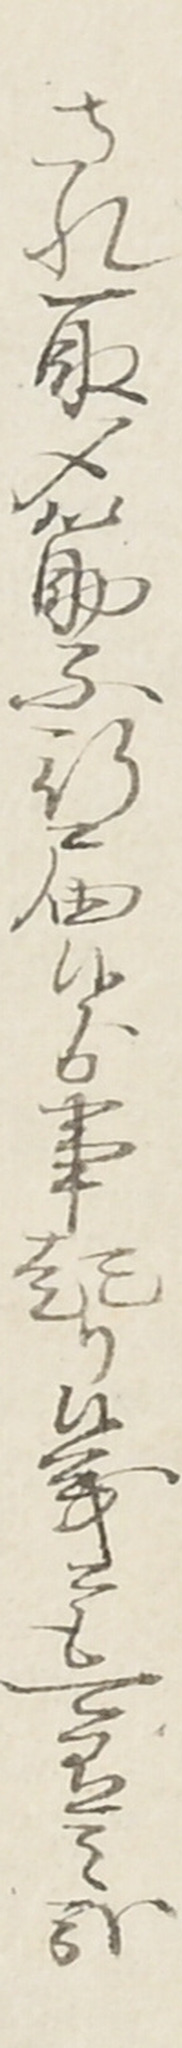され取〆筋不行届候ゟ事起リ候義ニも可有之哉
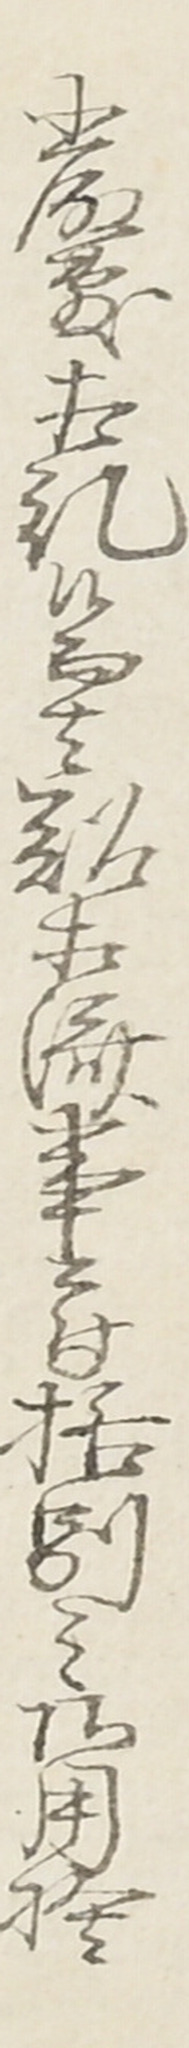厳敷相糺候而者難相済事ニ付格別之御用捨
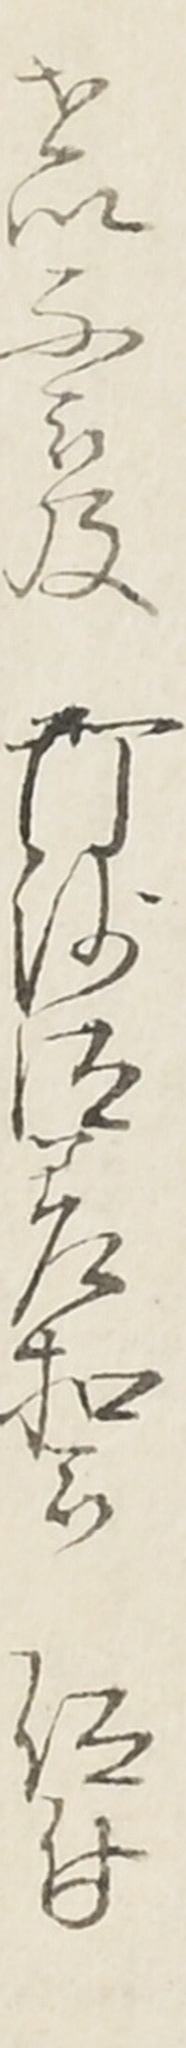を以不被及御沙汰差控被仰付
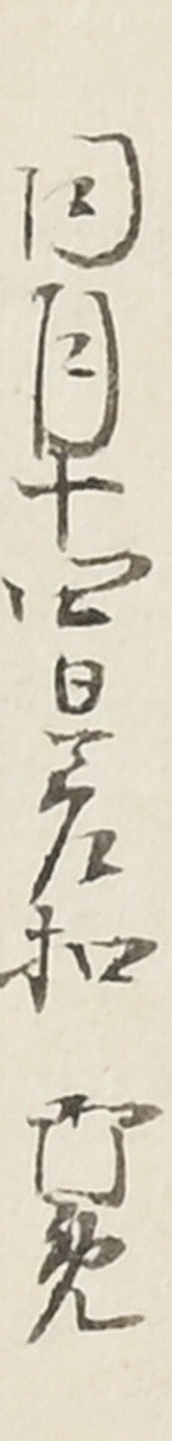一同月十四日差控御免
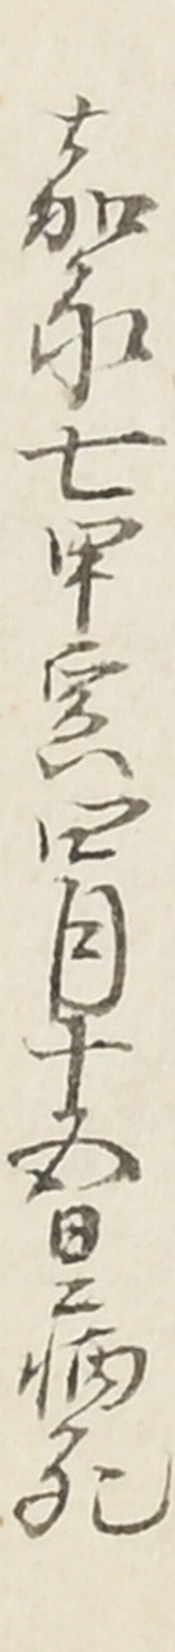一嘉永七甲寅四月十五日病死

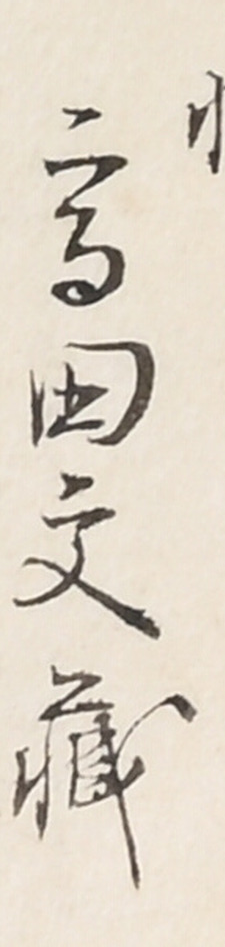高田文藏
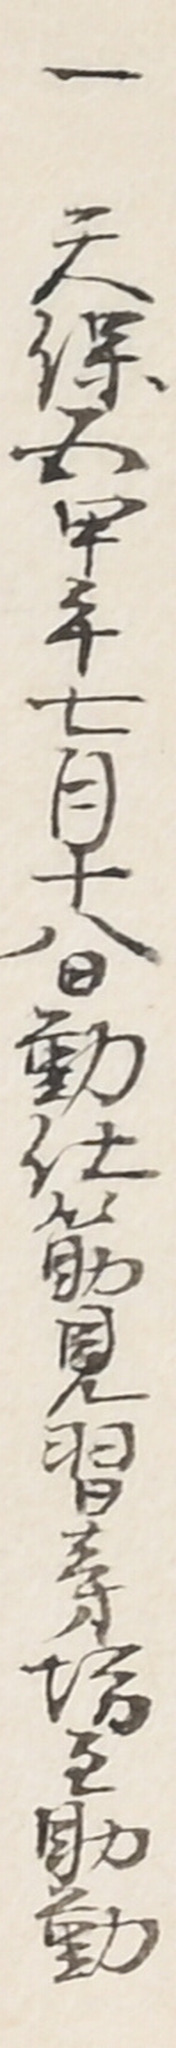一天保五甲午七月十八日勤仕筋見習旁坊主助勤
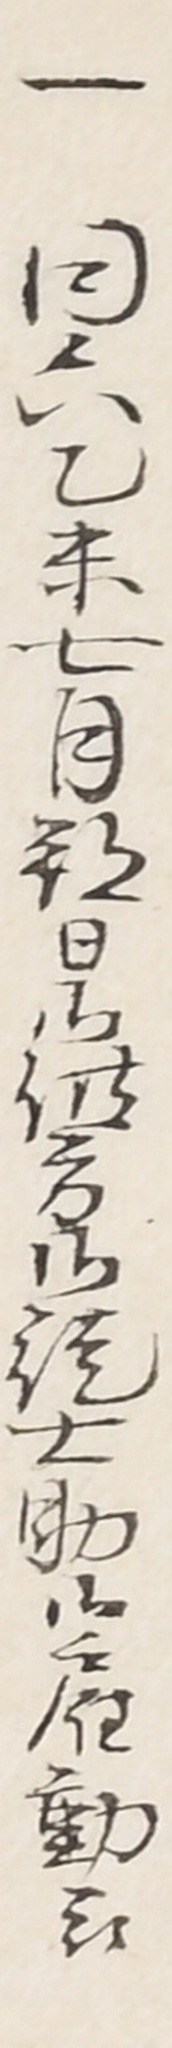一同六乙未朔日御供方御徒士助御雇勤被
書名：無足諸士勤仕録（四）
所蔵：伊那市立高遠町図書館・合同会社AMANE
